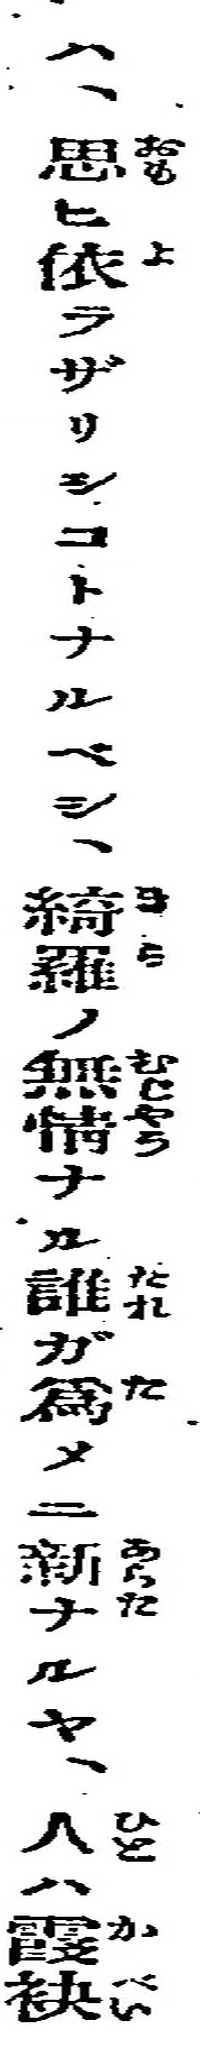ハ、思ヒ依ラザリシコトナルベシ、綺羅ノ無情ナル誰ガ為メニ新ナルヤ、人ハ霞袂
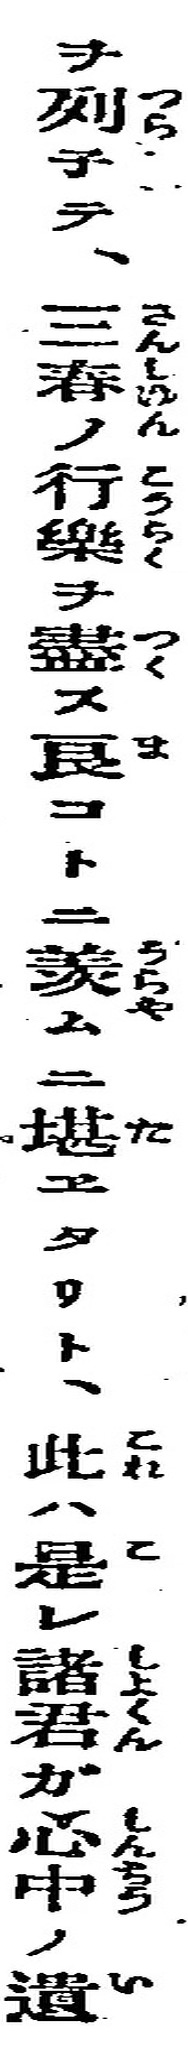ヲ列ネテ、三春ノ行楽ヲ尽ス良コトニ羨ムニ堪ヱタリト、此ハ是レ諸君ガ心中ノ遺
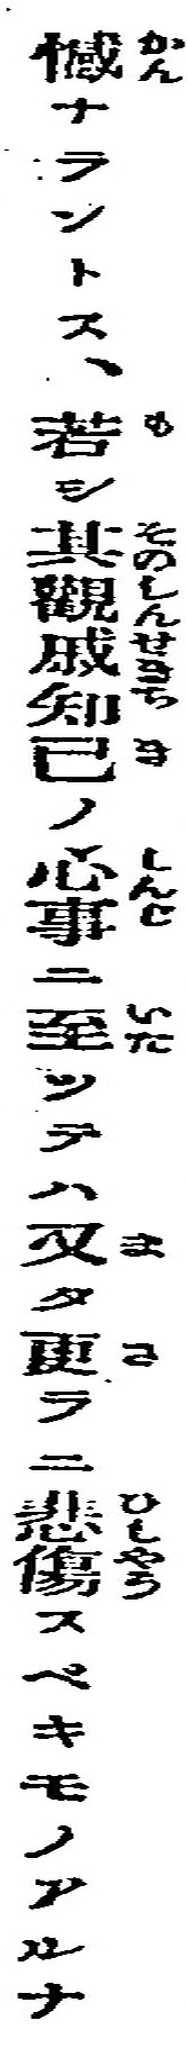憾ナラントス、若シ其観戚知己ノ心事ニ至ツテハ又タ更ラニ悲傷スベキモノアルナ
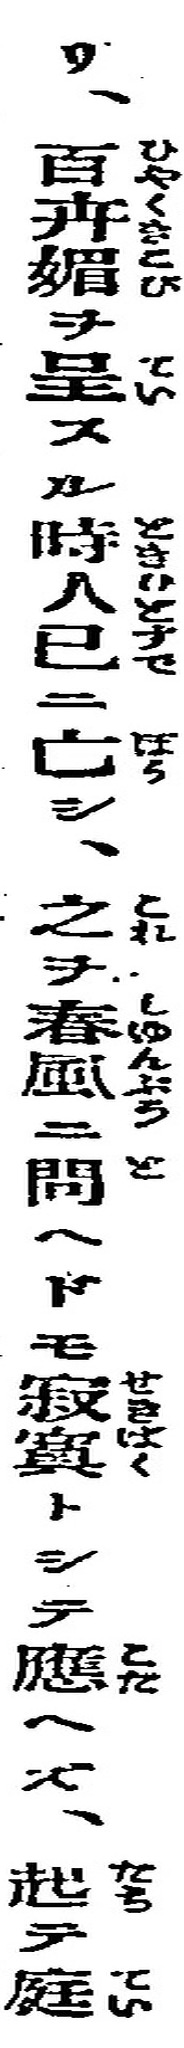リ、百卉媚ヲ呈スル時人已ニ亡シ、之ヲ春風ニ問へドモ寂寞トシテ応ヘズ、起テ庭
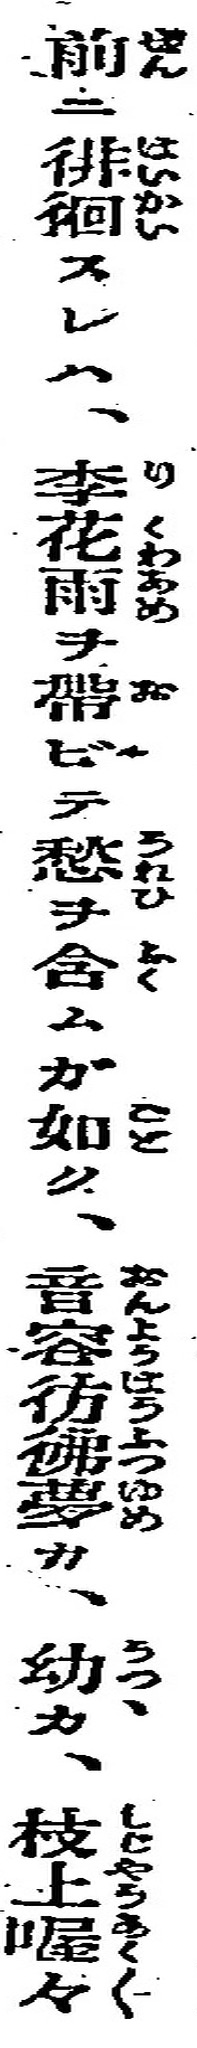前ニ徘徊スレハ、李花雨ヲ帯ビテ愁ヲ含ムガ如ク、音容彷彿夢カ、幻カ、枝上喔々
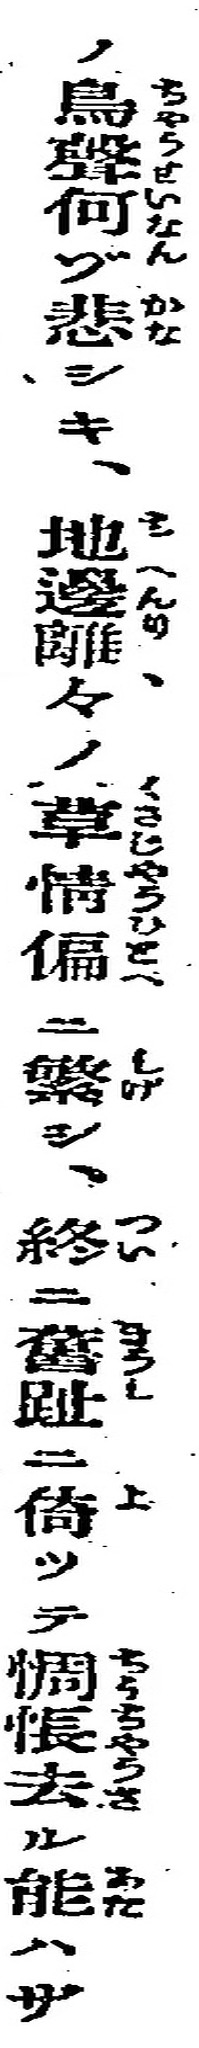ノ鳥声何ゾ悲シキ、地辺離々ノ草情偏ニ繁シ、終ニ旧趾ニ倚ツテ惆悵去ル能ハザ
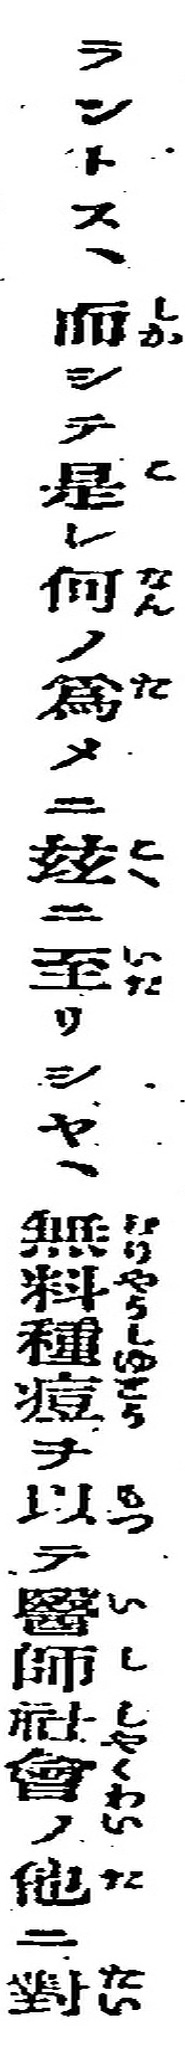ラントス、而シテ是レ何ノ為メニ茲ニ至リシヤ、無料種痘ヲ以テ医師社会ノ他ニ対
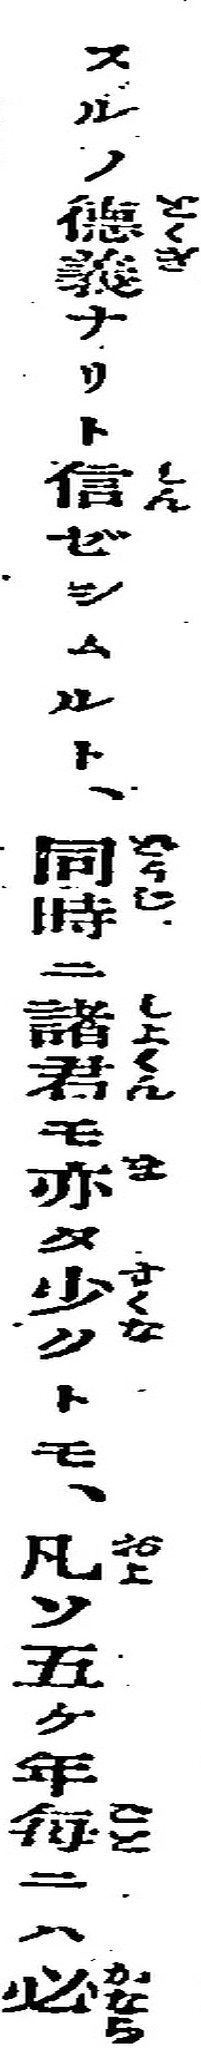スルノ徳義ナリト信ゼシムルト、同時ニ諸君モ亦タ少クトモ、凡ソ五ケ年毎ニハ必
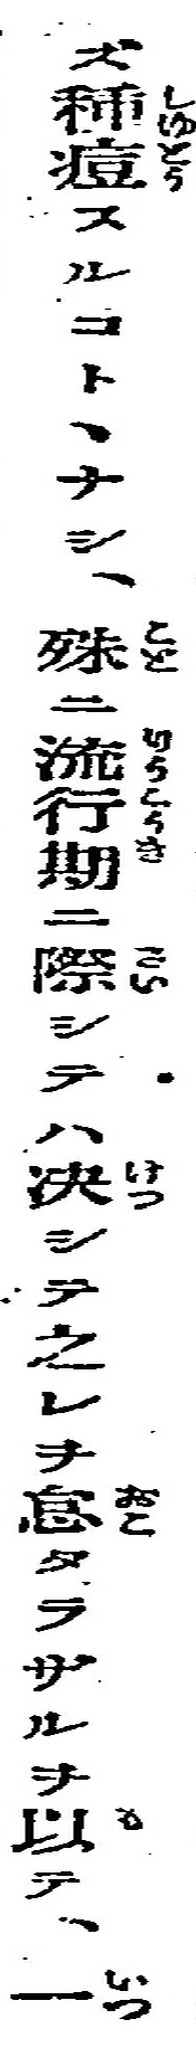ズ種痘スルコトヽナシ、殊ニ流行期ニ際シテハ決シテ之レヲ怠タラザルヲ以テ、一
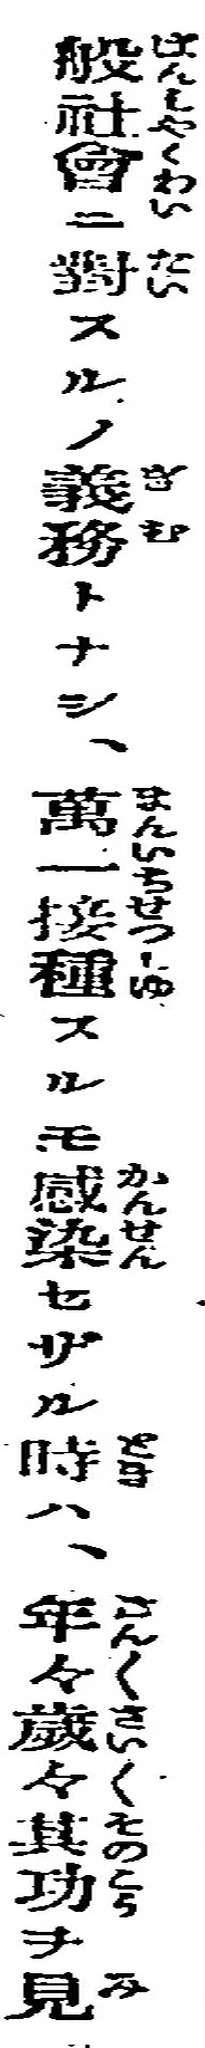般社会ニ対スルノ義務トナシ、万一接種スルモ感染セザル時ハ、年々歳々其功ヲ見
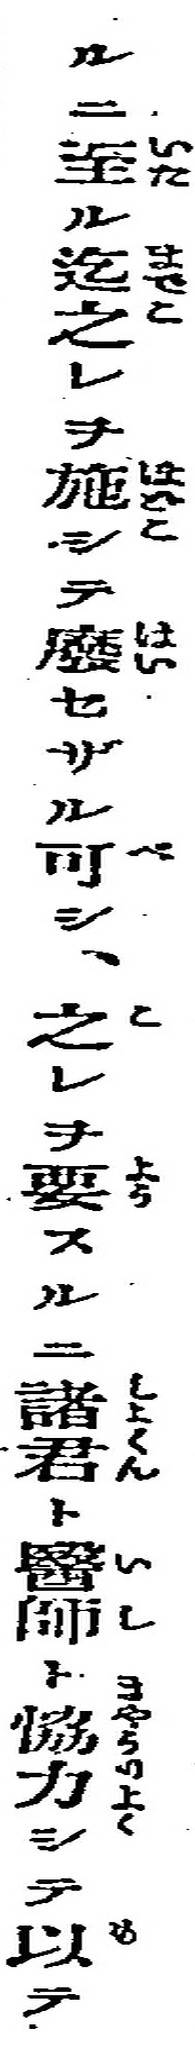ルニ至ル迄之レヲ施シテ廃セザル可シ、之レヲ要スルニ諸君ト医師ト協力シテ以テ
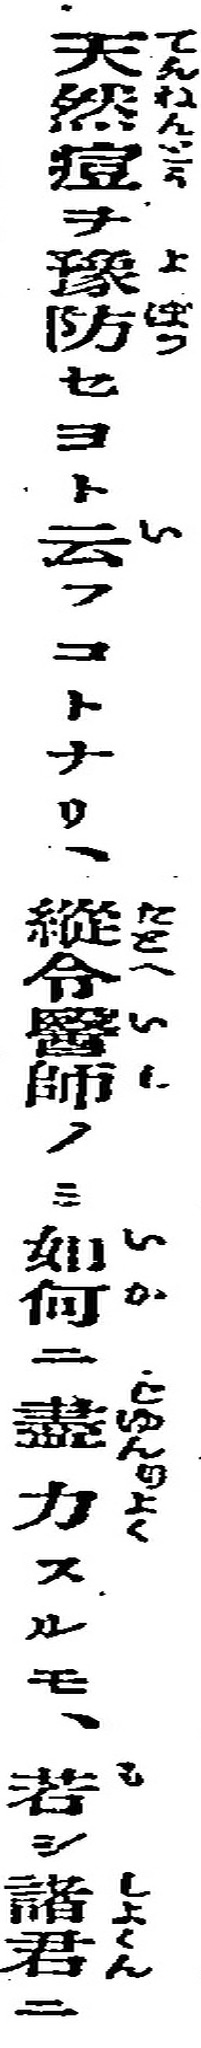天然痘ヲ予防セヨト云フコトナリ、縱令医師ノミ如何ニ尽力スルモ、若シ諸君ニ
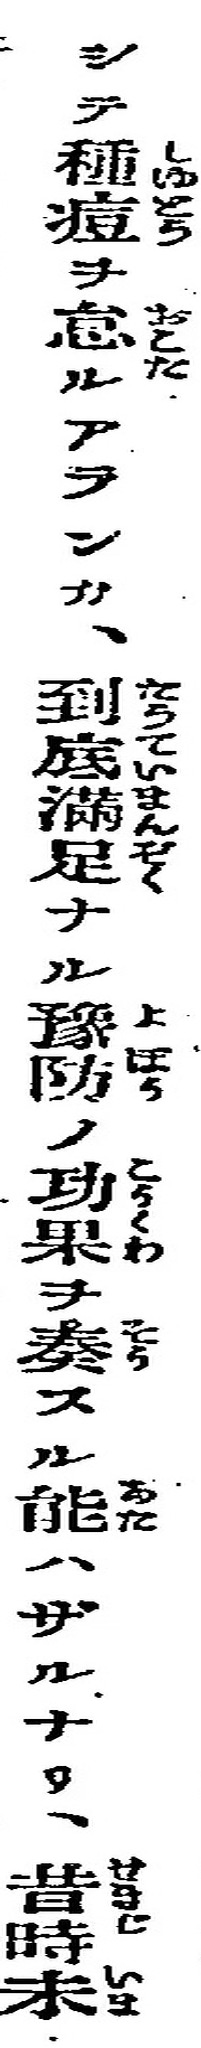シテ種痘ヲ怠ルアランカ、到底満足ナル予防ノ功果ヲ奏スル能ハザルナリ、昔時未
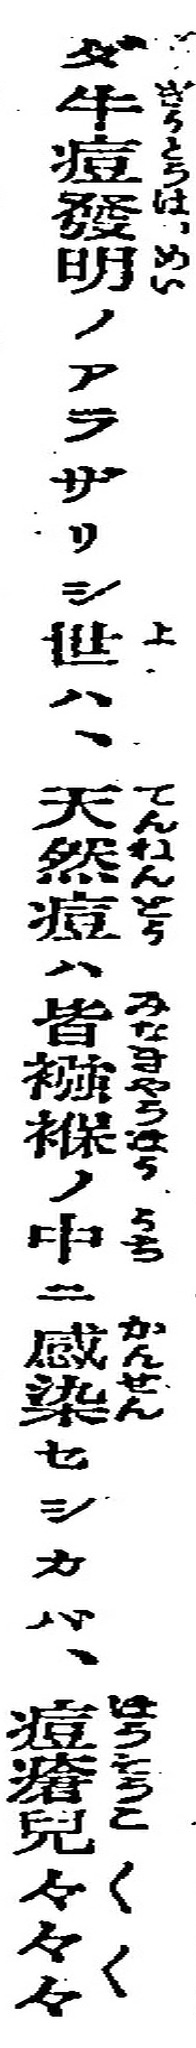ダ牛痘発明ノアラザリシ世ハ、天然痘ハ皆襁褓ノ中ニ感染セシカバ、痘瘡児々々々
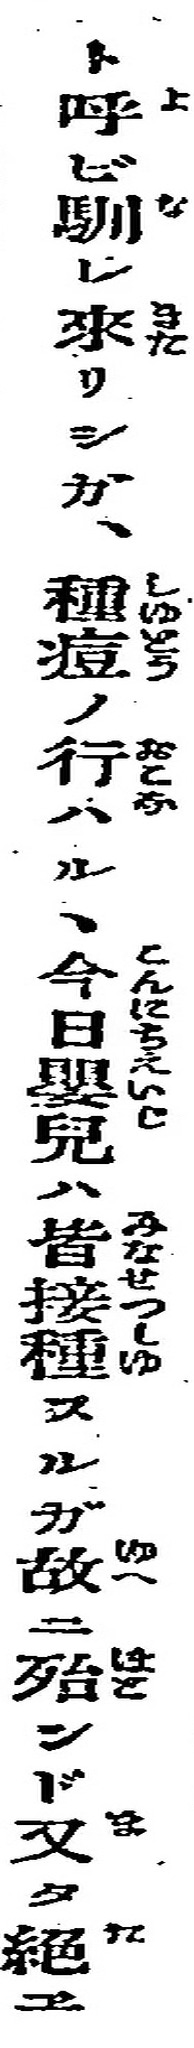ト呼ビ馴レ来リシガ、種痘ノ行ハルヽ今日嬰児ハ皆接種スルガ故ニ殆ンド又タ絶ヱ
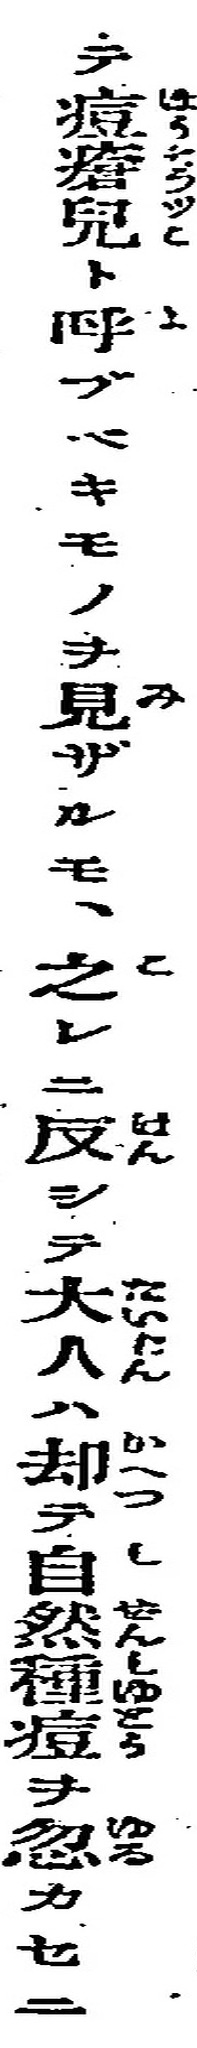テ痘瘡児ト呼ブベキモノヲ見ザルモ、之レニ反シテ大人ハ却テ自然種痘ヲ忽カセニ
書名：天然痘予防注意兼種痘者之注意
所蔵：国立国会図書館 National Diet Library, JAPAN
